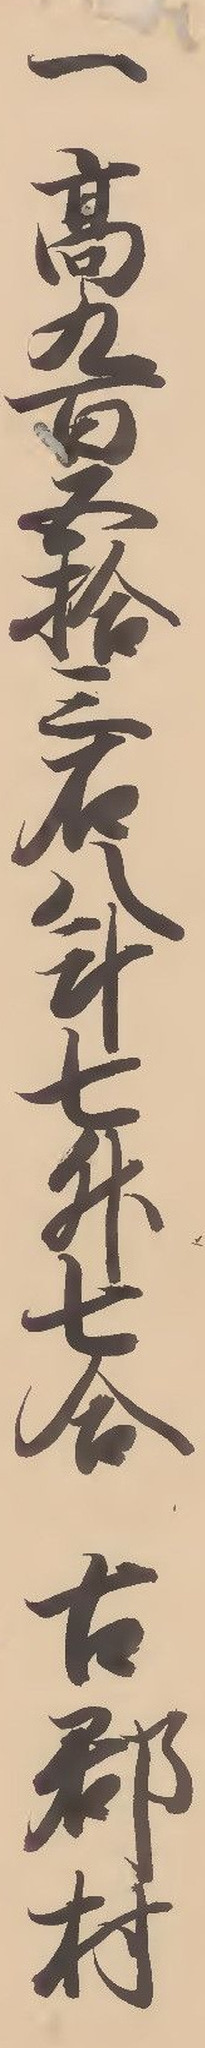一高九百五拾三石八斗七升七合古郡村
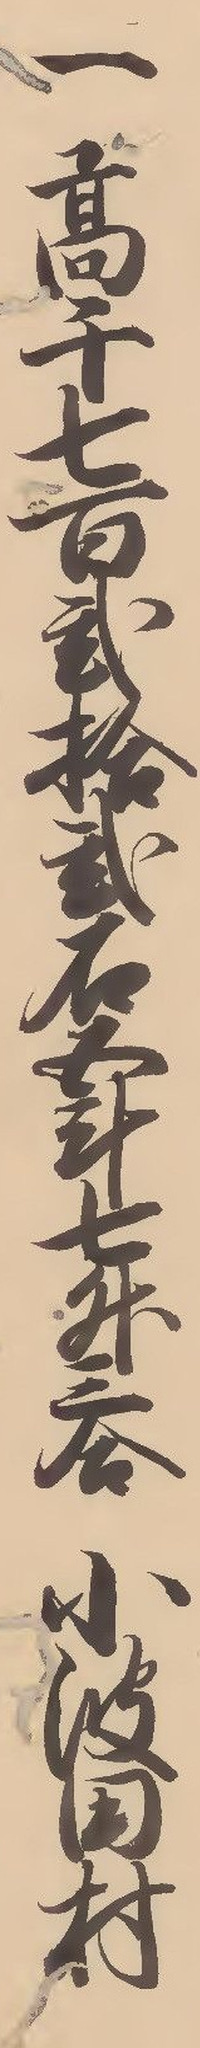一高千七百弐拾弐石五斗七升三合小波田村

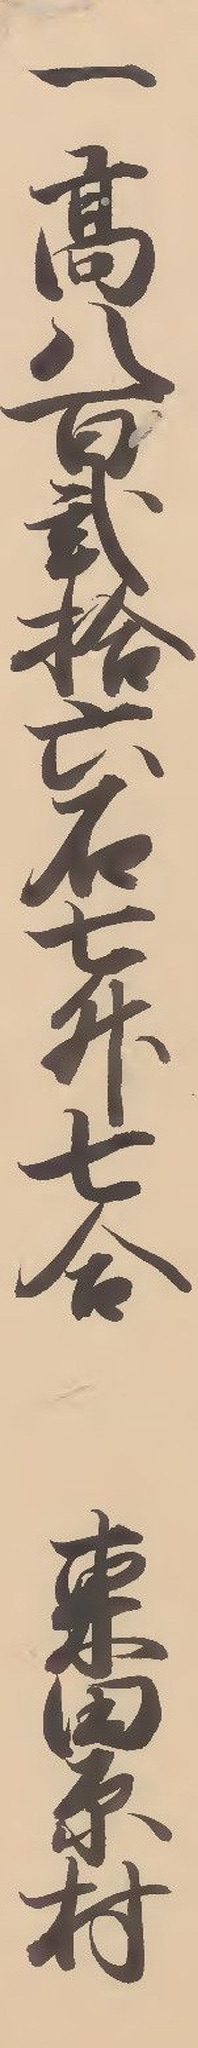一高八百弐拾六石七升七合東田原村
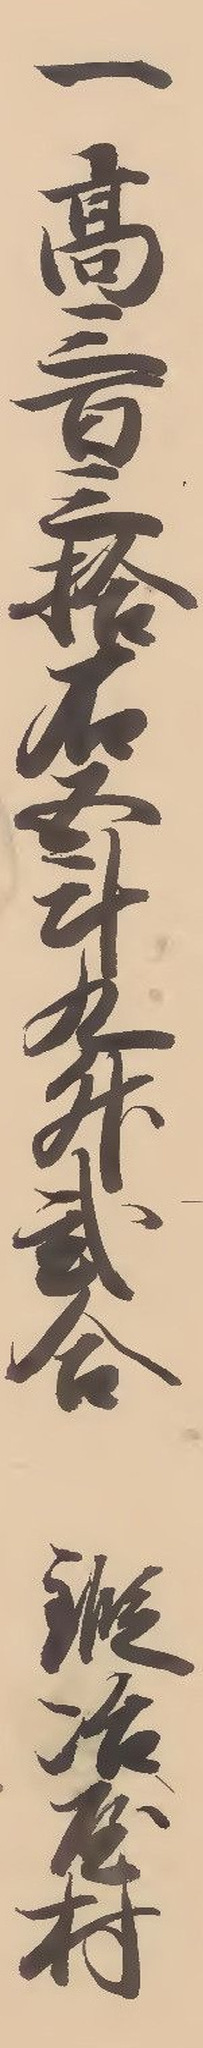一高三百三拾石五斗九升弐合鍛冶屋村
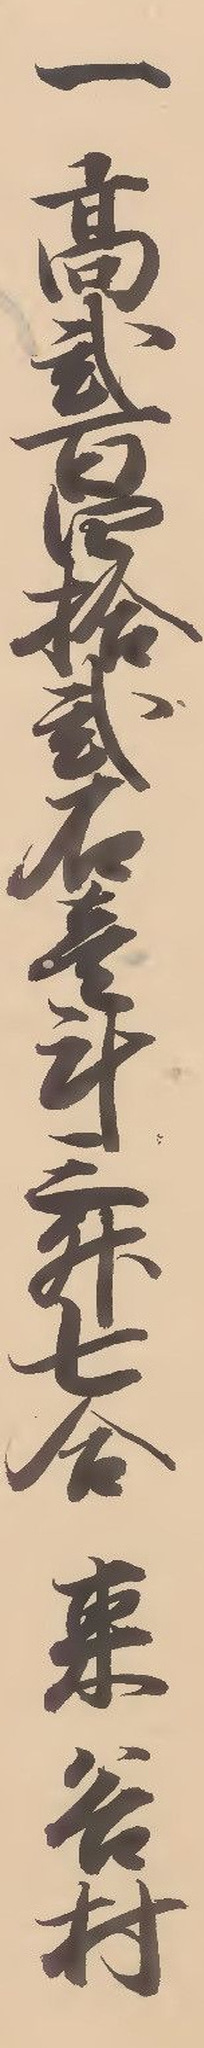一高弐百四拾弐石壱斗三升七合東谷村
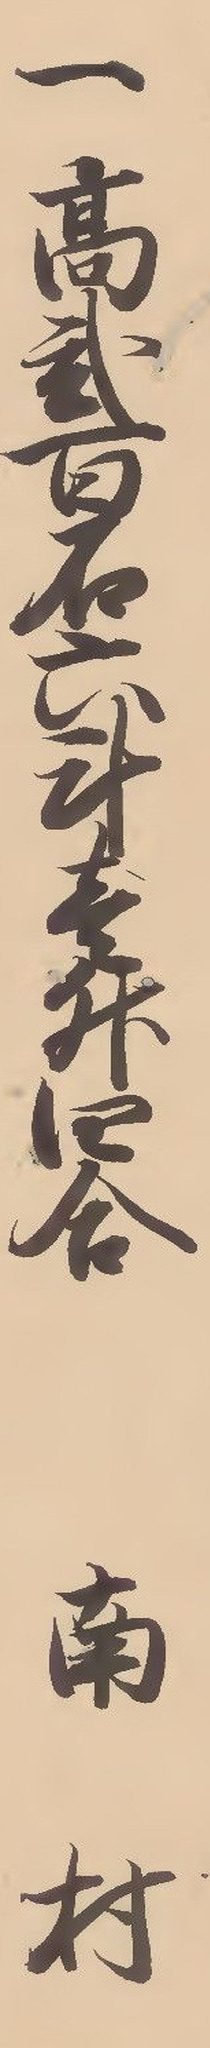一高弐百石六斗壱升四合南村
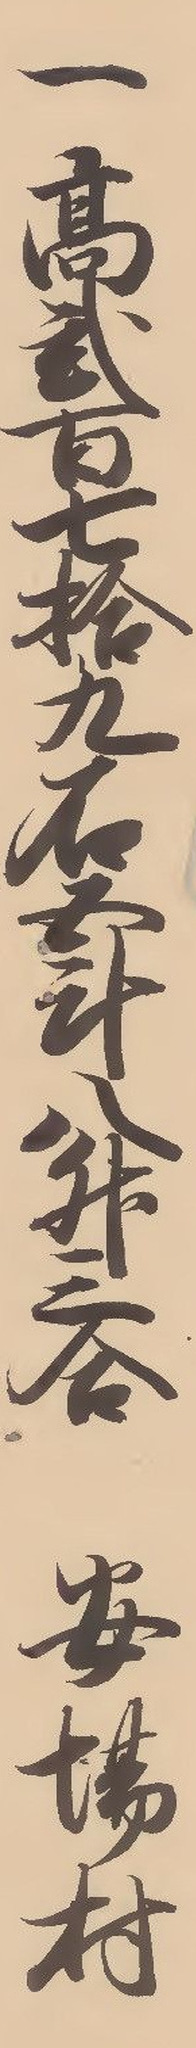一高弐百七拾九石五斗八升三合安場村
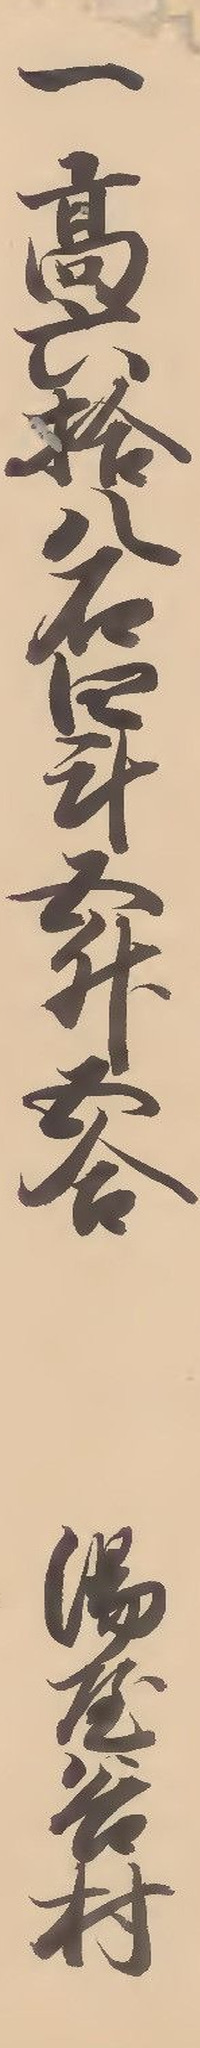一高六拾八石四斗五升五合湯屋谷村
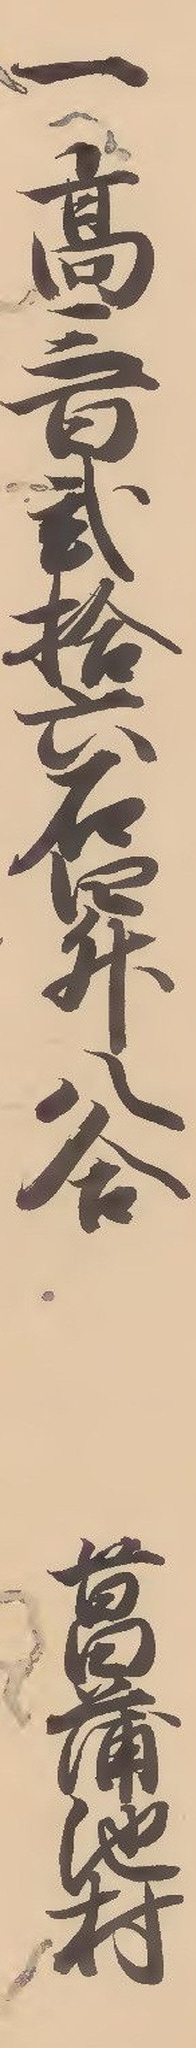一高三百弐拾六石四升八合菖蒲池村

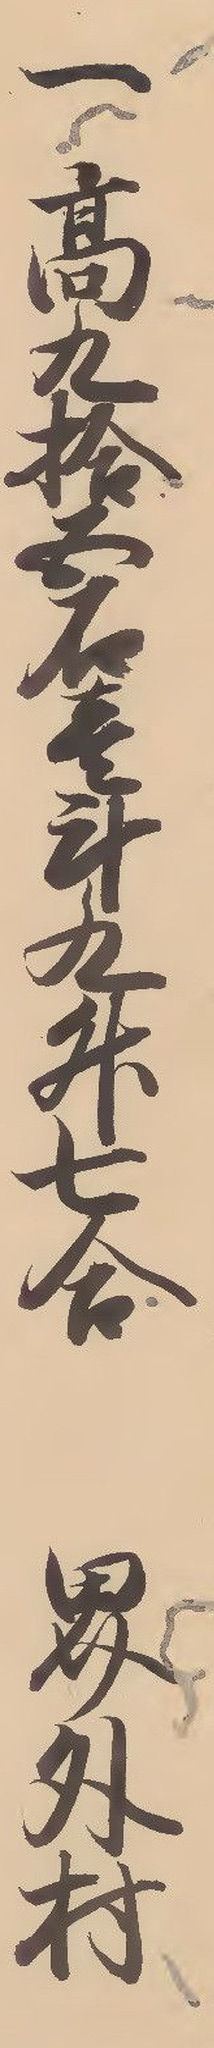一高九拾五石壱斗九升七合界外村
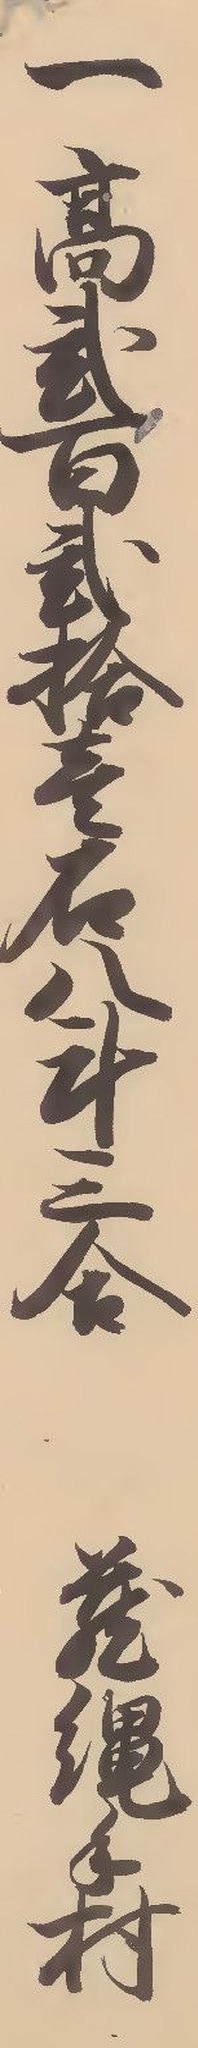一高弐百弐拾壱石八斗三合蔵縄手村
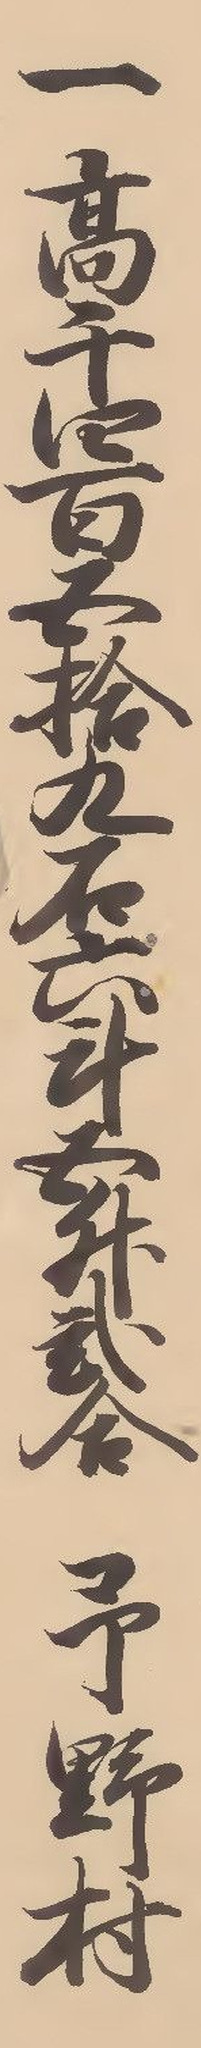一高千四百五拾九石六斗五升弐合予野村
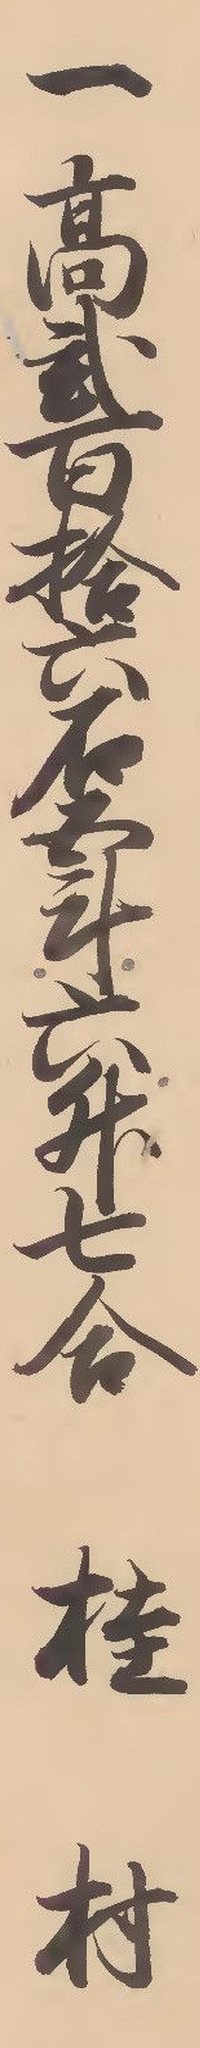一高弐百拾六石五斗六升七合桂村
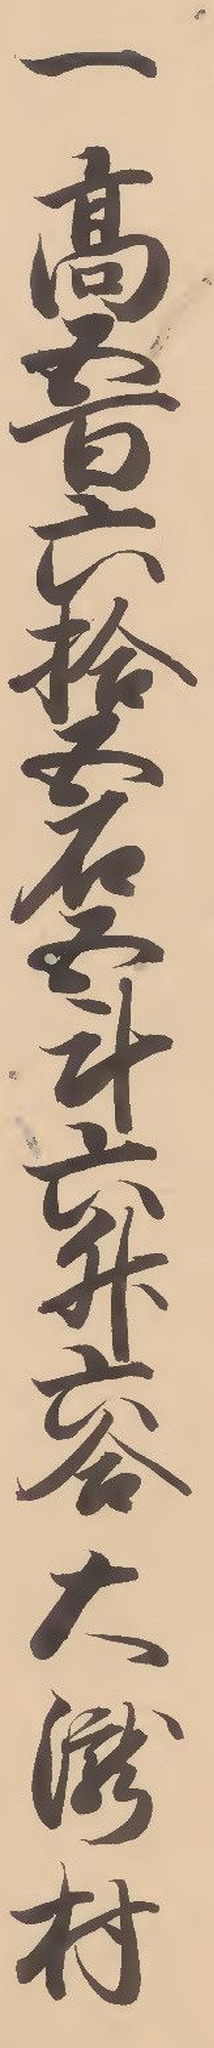一高五百六拾五石五斗六升六合大滝村
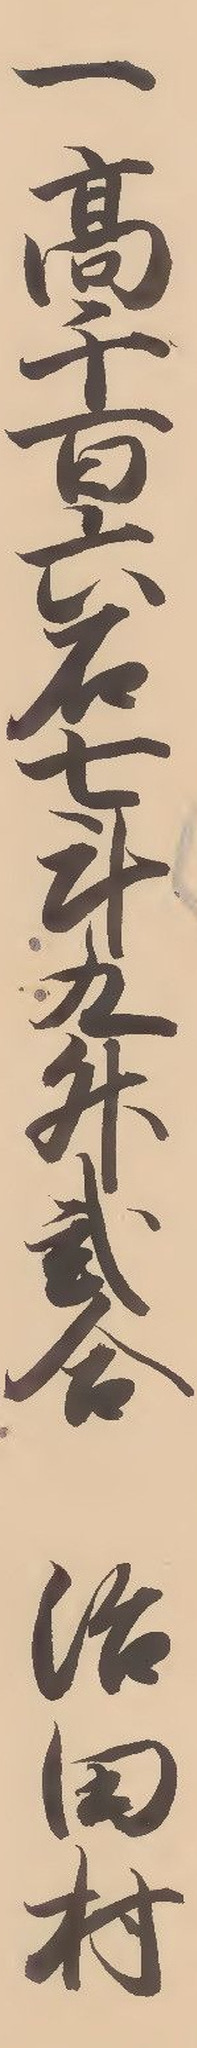一高千百六石七斗九升弐合治田村
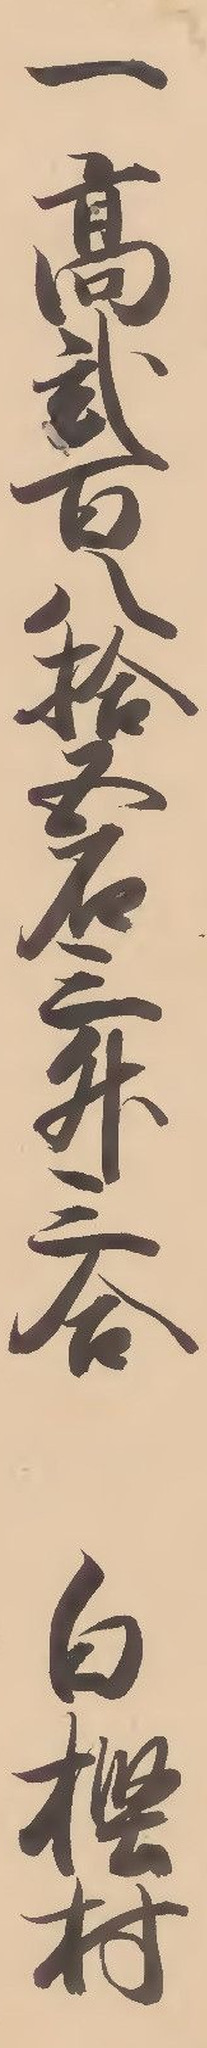一高弐百八拾五石三升三合白樫村
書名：伊賀国郷帳
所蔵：国立公文書館 National Archives of Japan
